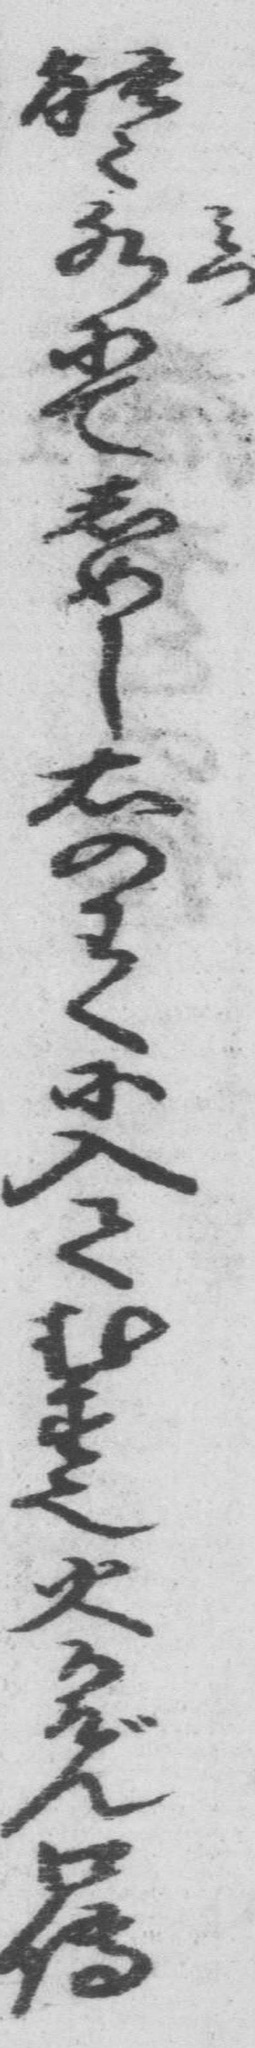能々水にてしめし右のわくに入むす也火かげん口傳
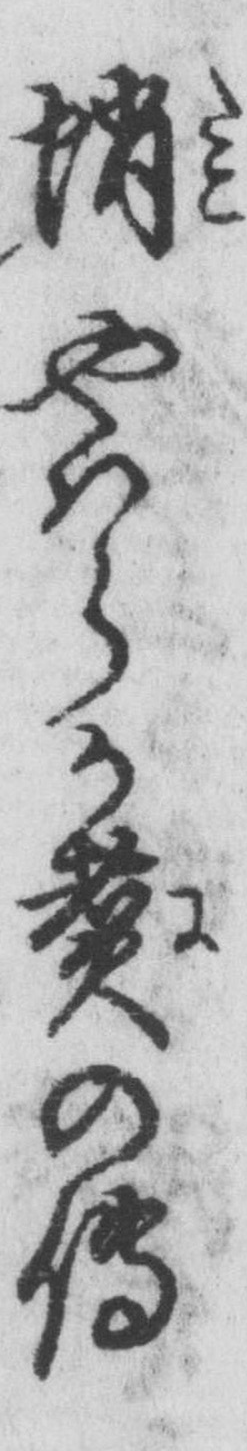蛸やハらか煮の傳
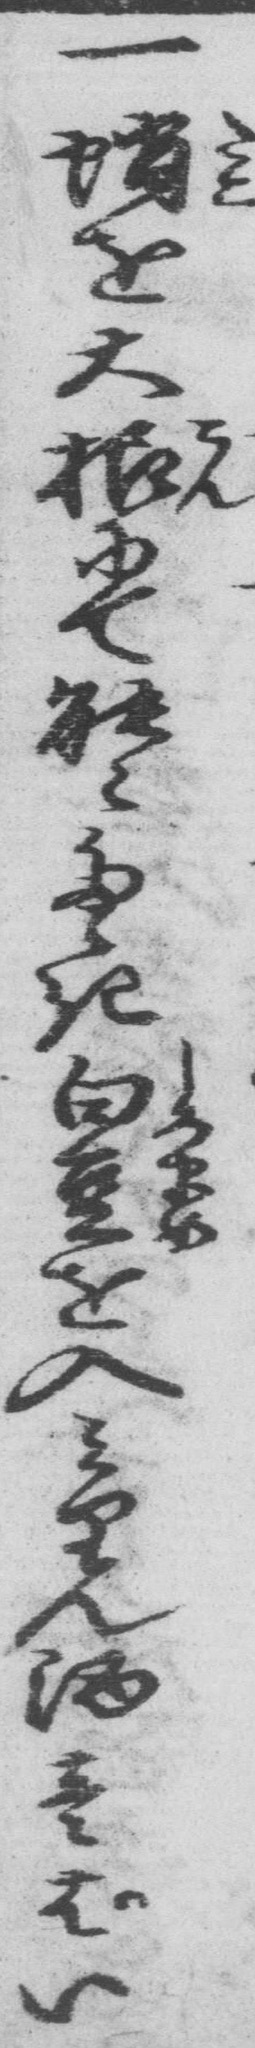一蛸を大根にて能々まき白豆を入ミりん酒青ばい

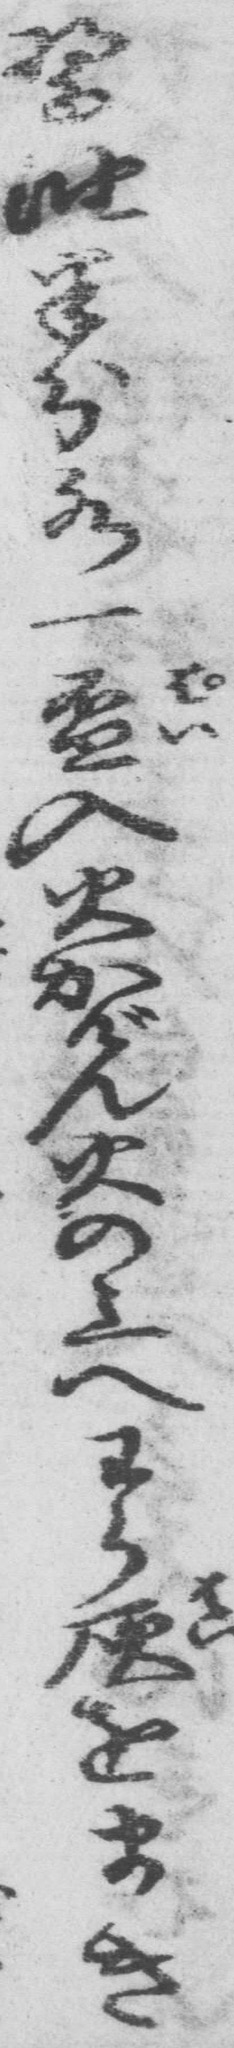醤油半分水一盃入火かげん日の上へわら灰をまき
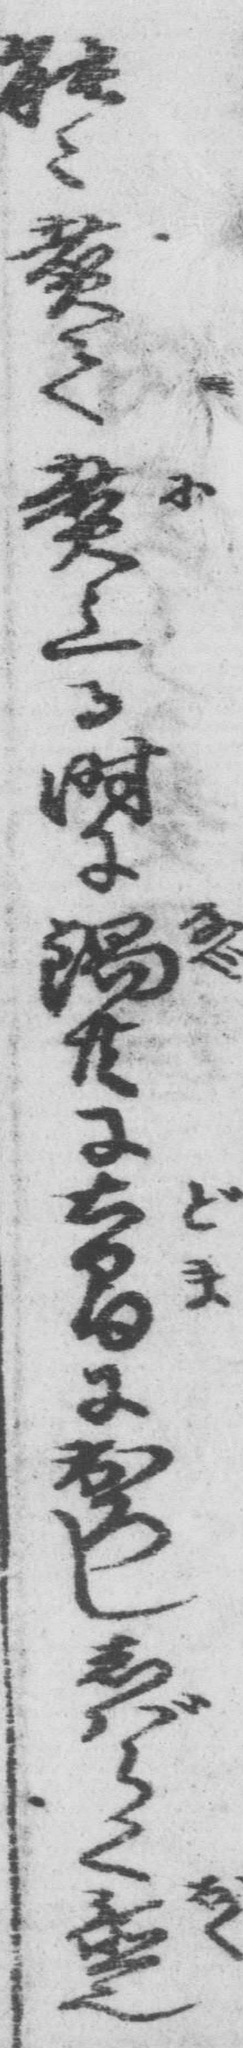能々煮て煮上る鍋に土間におろししバらく置也
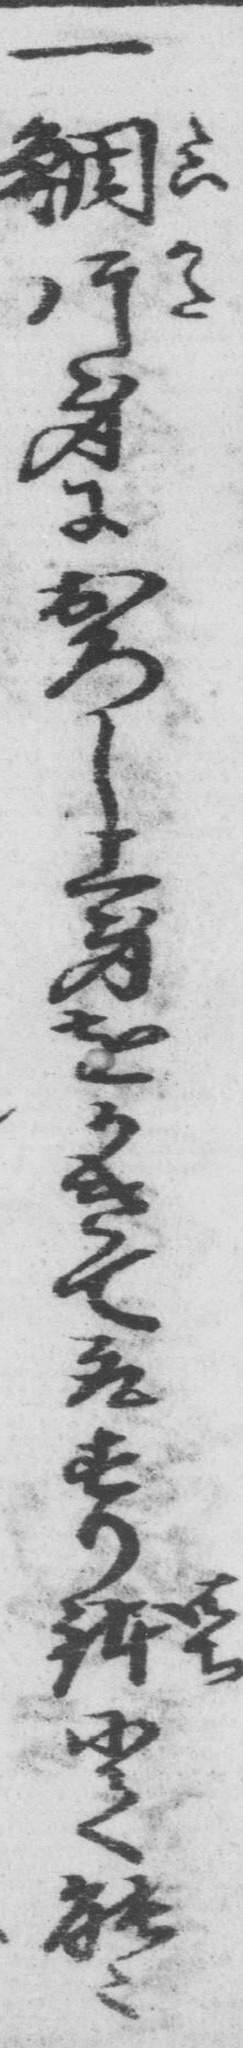一鯛片身におろし上身をかきて取すり鉢にて能々
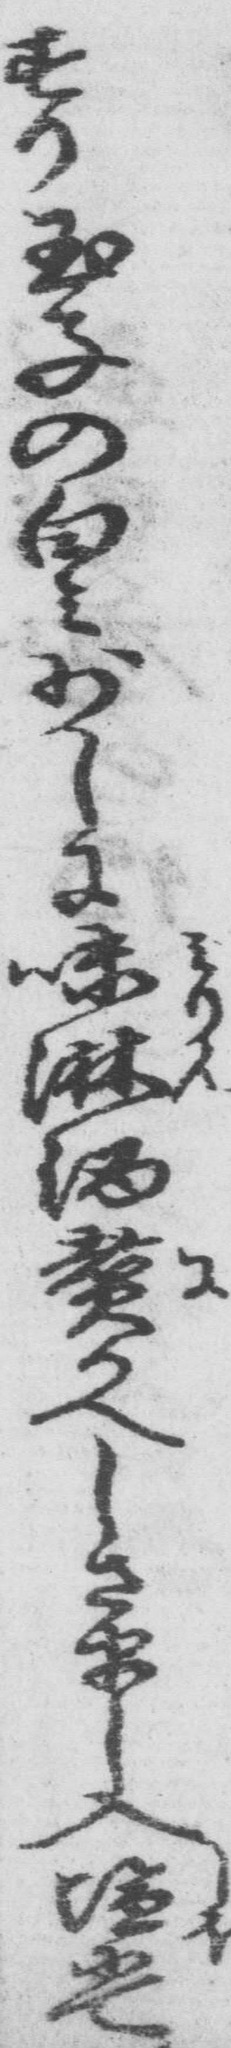すり玉子の白ミ少しに味醂酒煮かへしさまし入塩にて
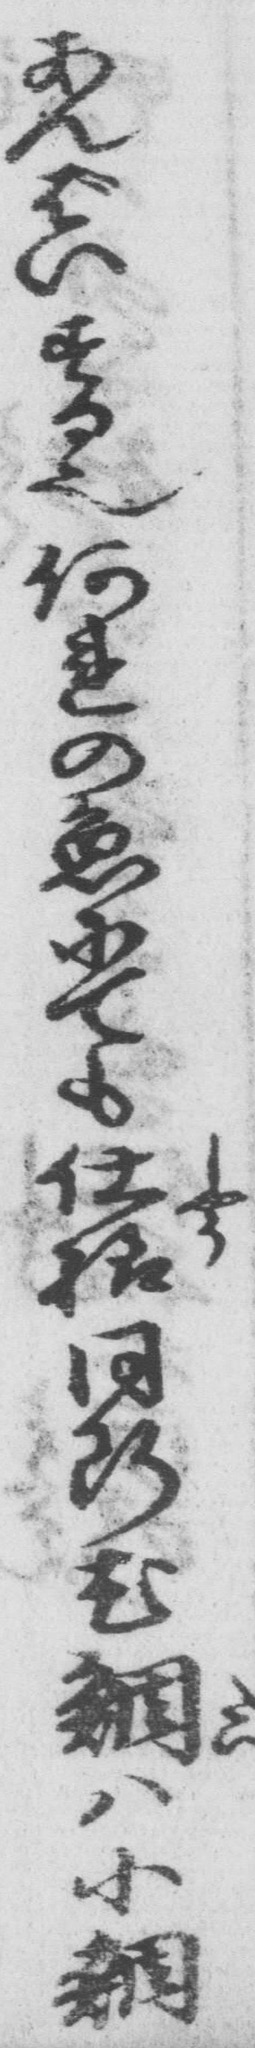あんばいする何れれの魚にても同段尤鯛ハ小鯛
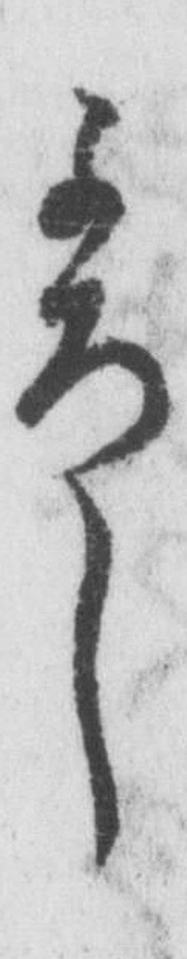よろし
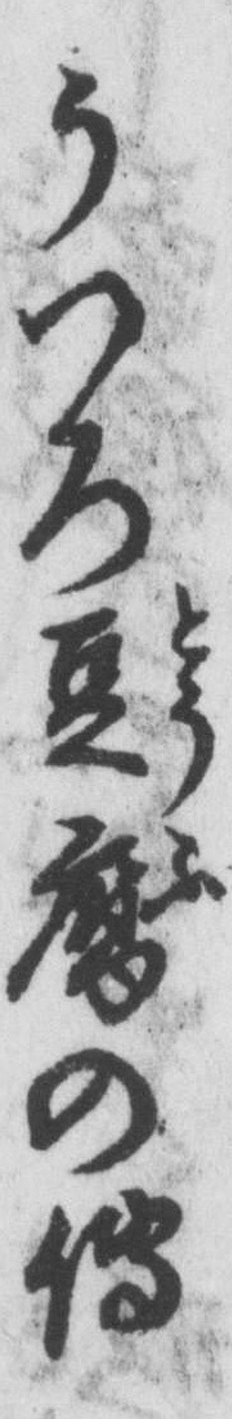うつろ豆腐の傳
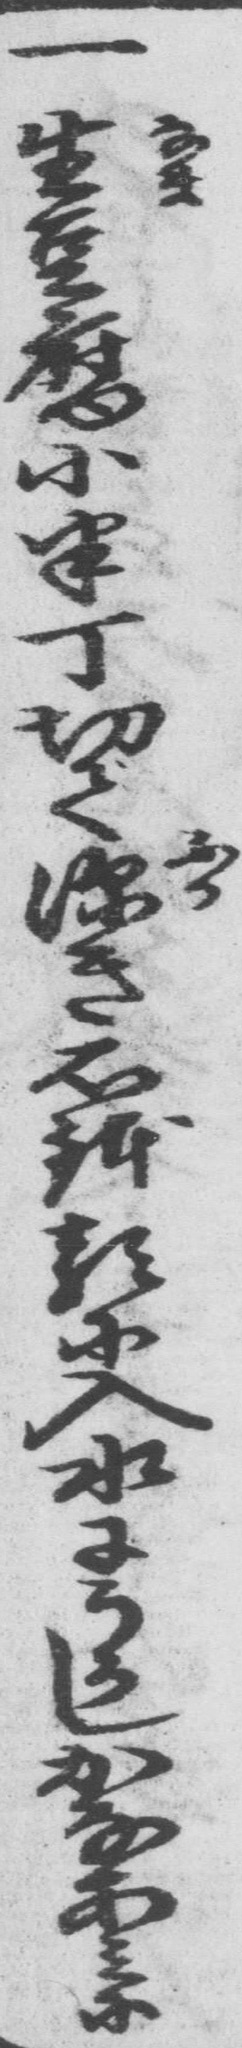一生の豆腐丁切て深き石鉢に入水にかへしかなあミに
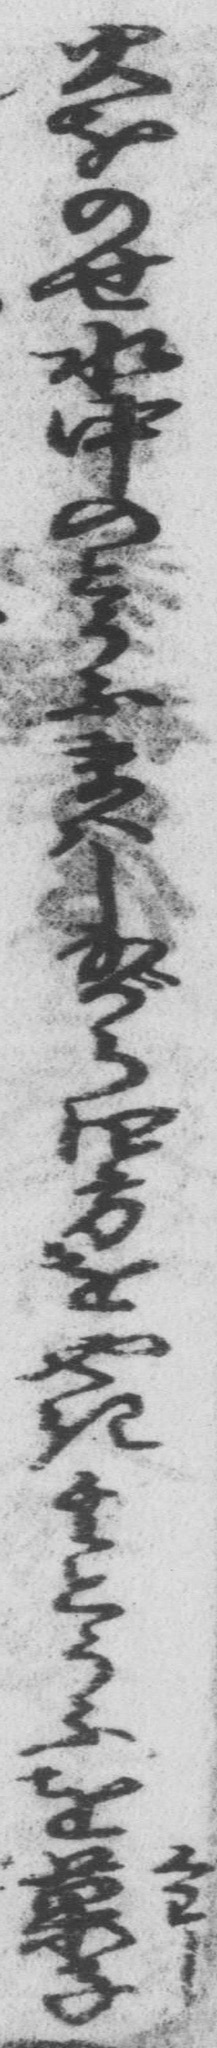火をのせ水中のとうふまはしながら使四方をやきとうふを菓子
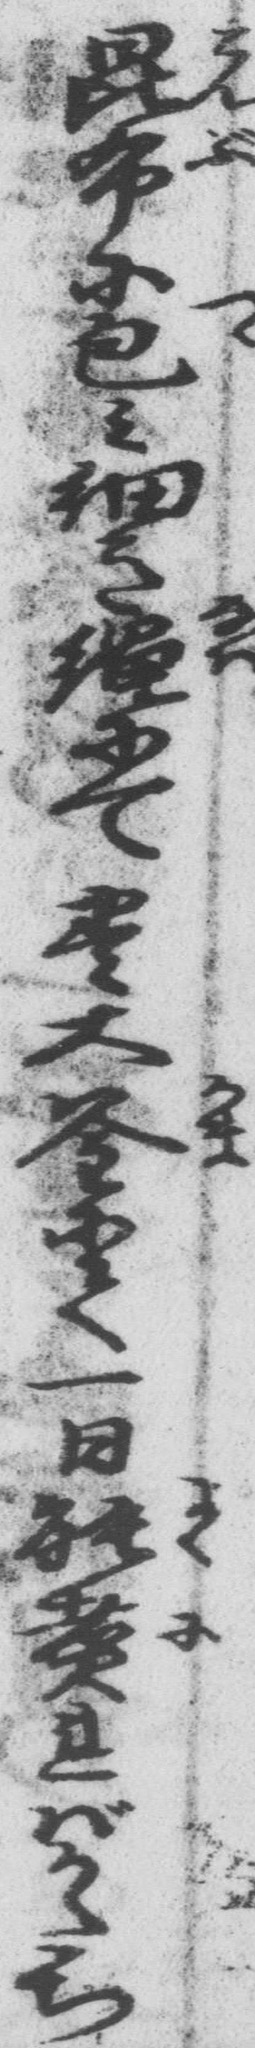昆布に包ミ細き縄にて大釜にて一日能煮れバかたち
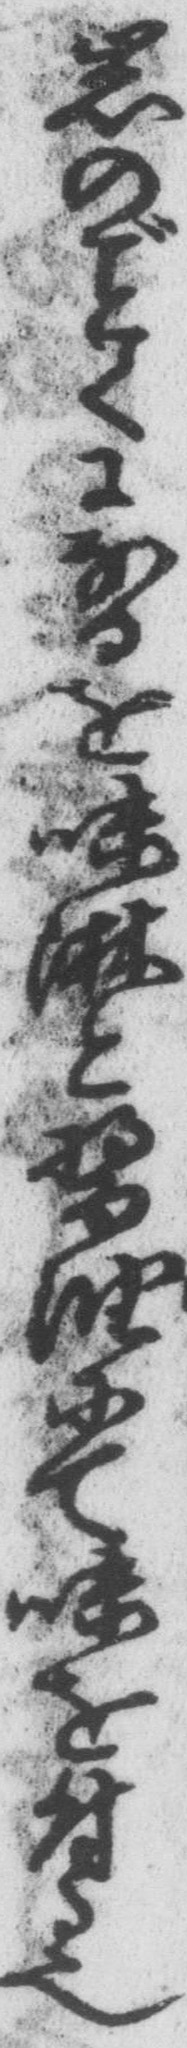思いのごとくになるを味醂と醤油にて味を付る也
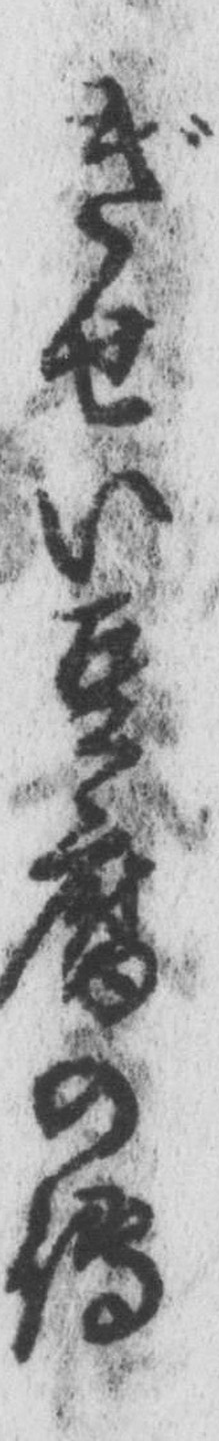ぎせい豆腐の傳
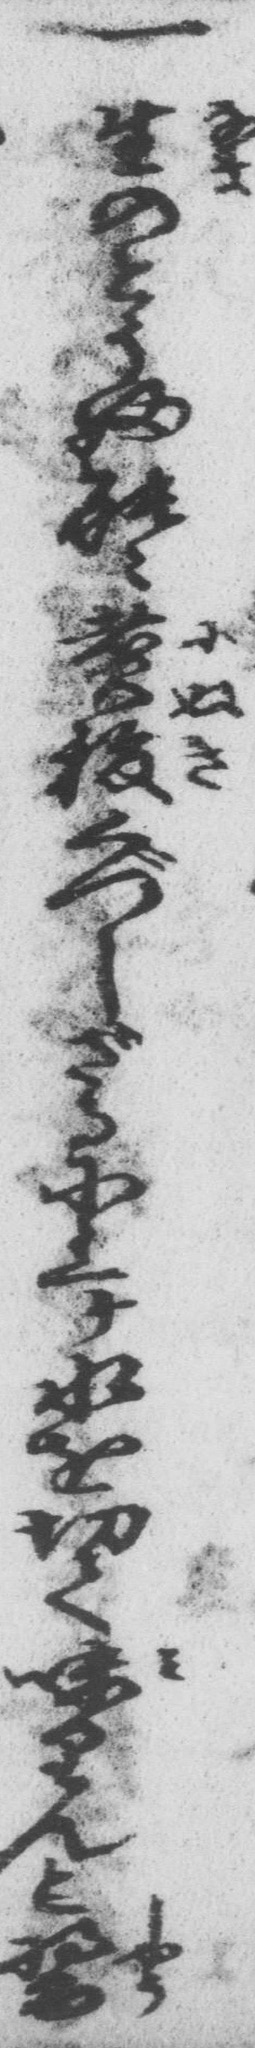一生の豆腐能々煮抜きくづしざるに上ゲ味りんと醤
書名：当世料理献立
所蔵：大阪府立大学学術情報センター 国文学研究資料館
